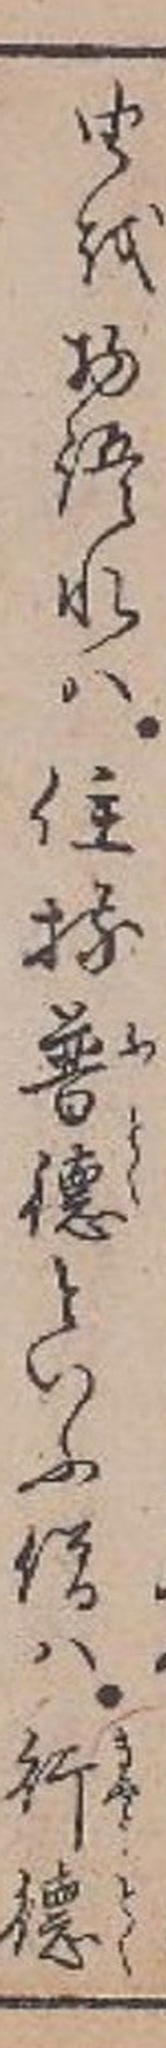由を物語れは、住持普徳といふ僧は、行徳
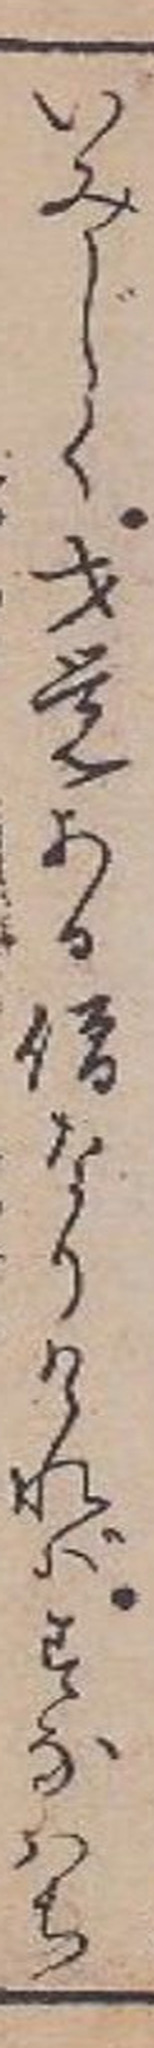いみじく、才覚ある僧なりければ、すなはち
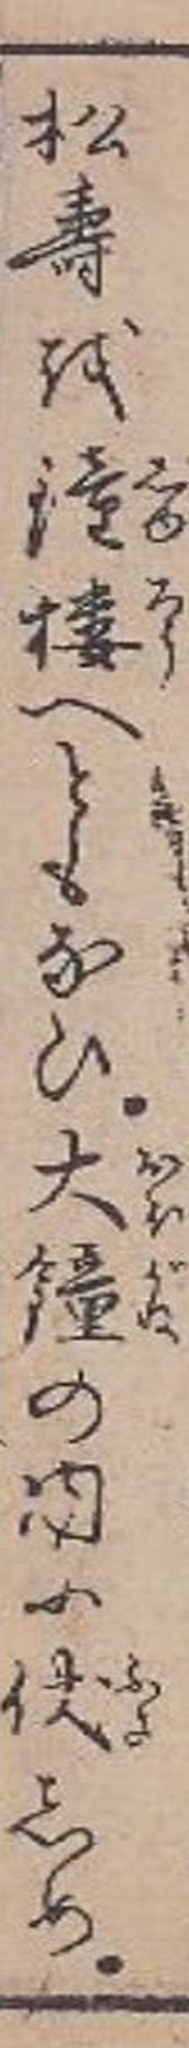松寿を鐘楼へともなひ、大鐘の内に伏しめ、
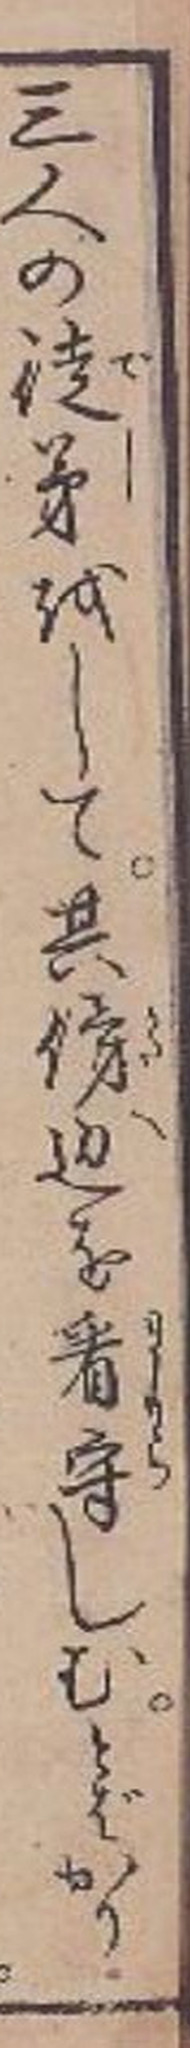三人の徒弟をして、其傍辺を看守しむ、とばかり
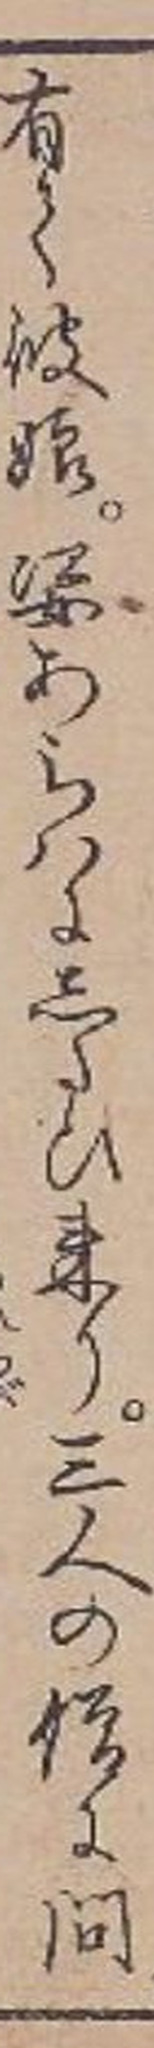有て彼姫、姿あらはにしたひ来り、三人の僧に問、
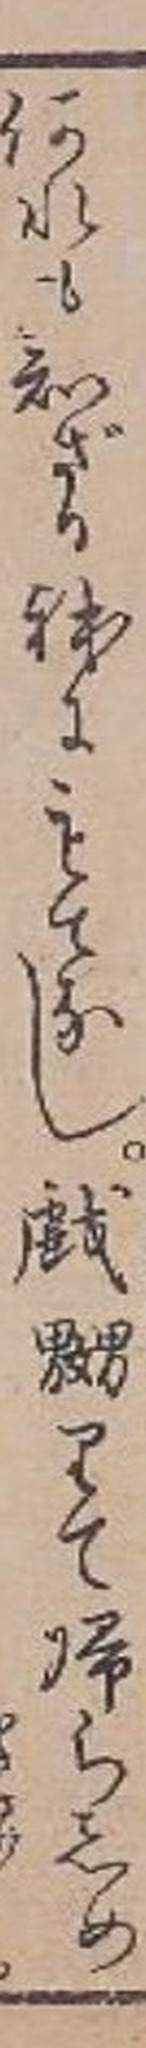何れも知ざる体にもてなし、戯嬲りて帰らしめ
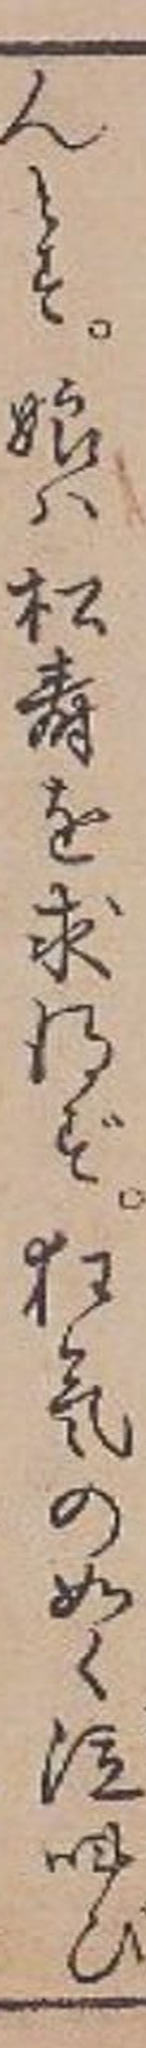んとす、娘は松寿を求得ず、狂気の如く泣叫び、
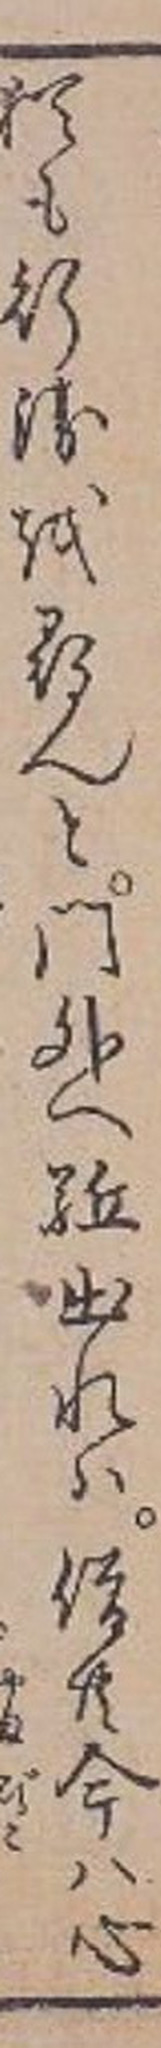猶も行衛を尋んと、門外へ駈出れは、僧共今は心
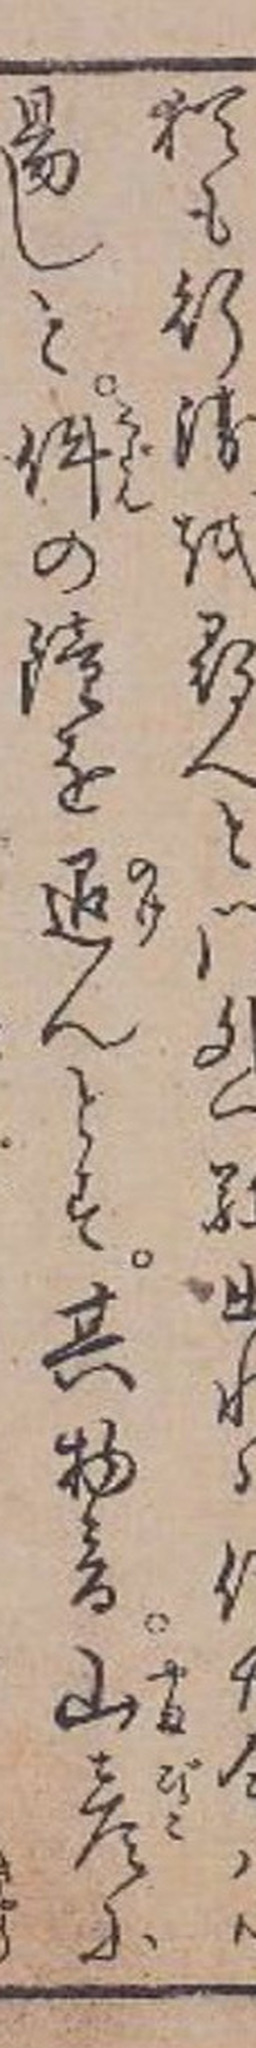易しと、件の鐘を退んとす、其物音、山彦に
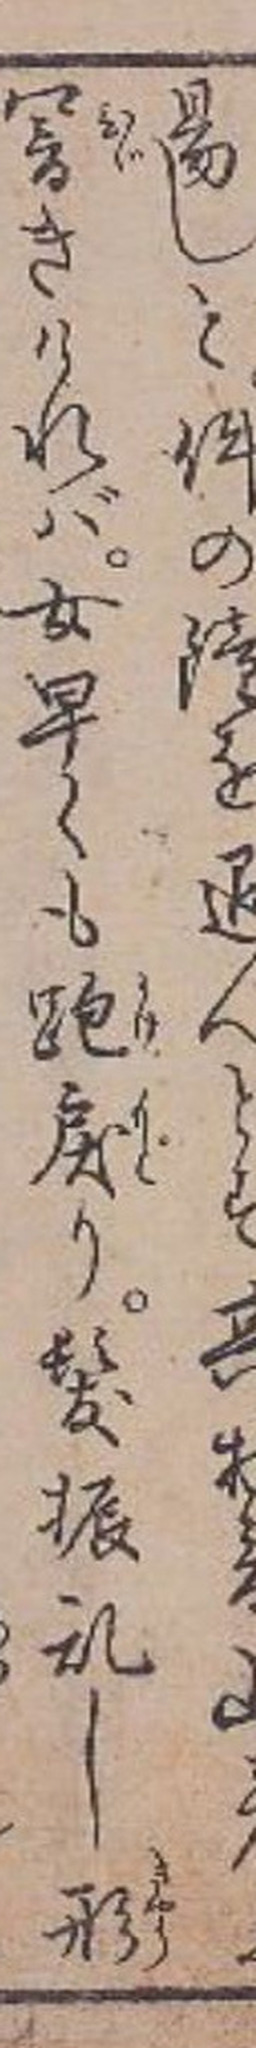響きければ、女早くも馳戻り、髪振乱し形
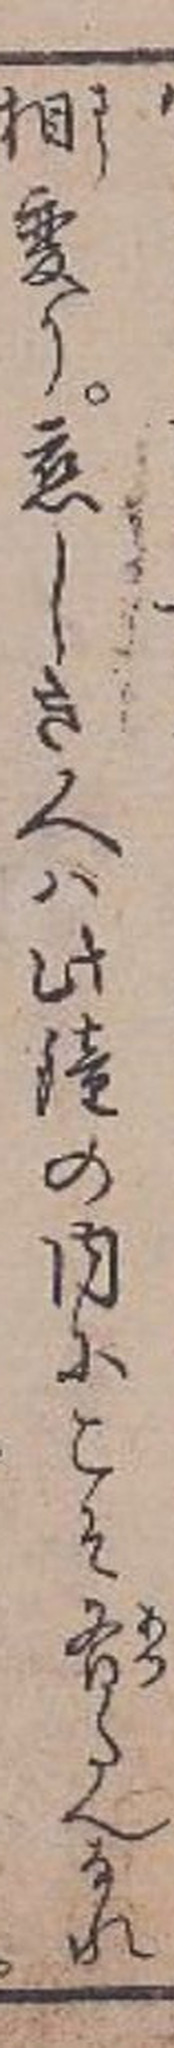相変り、恋しき人は此鐘の内にこそ有らんなれ
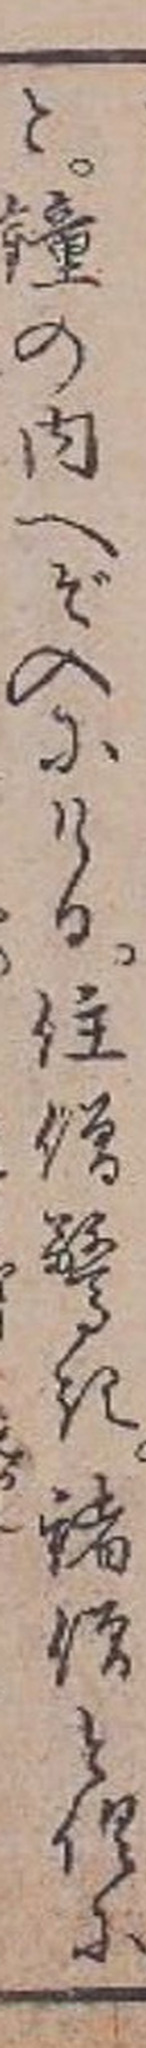と、鐘の内へぞ入にける、住僧驚き、諸僧と俱に、
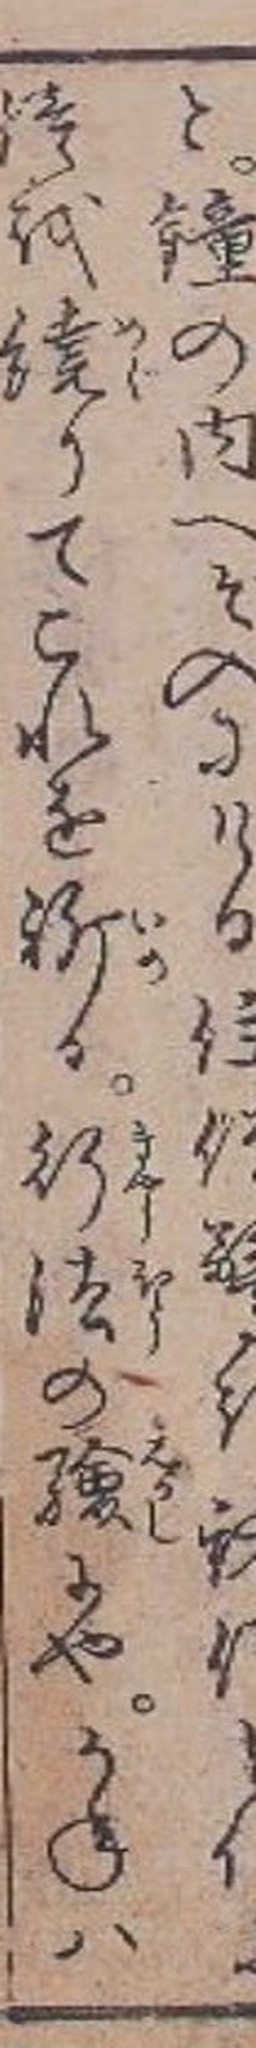鐘を繞りてこれを祈る、行法の験にや、かねは

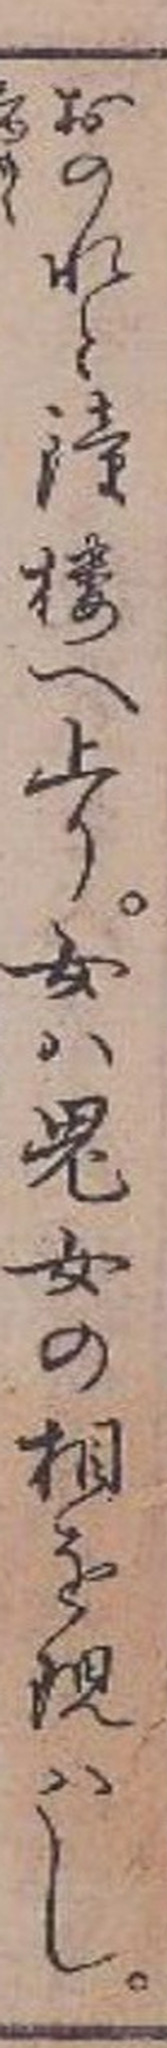おのれと鐘楼へ上り、女は鬼女の相を現はし、
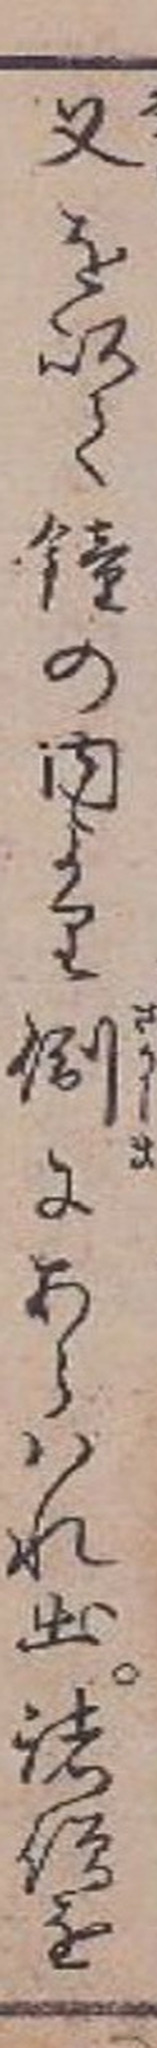叉を以て鐘の内より倒にあらはれ出、諸僧を
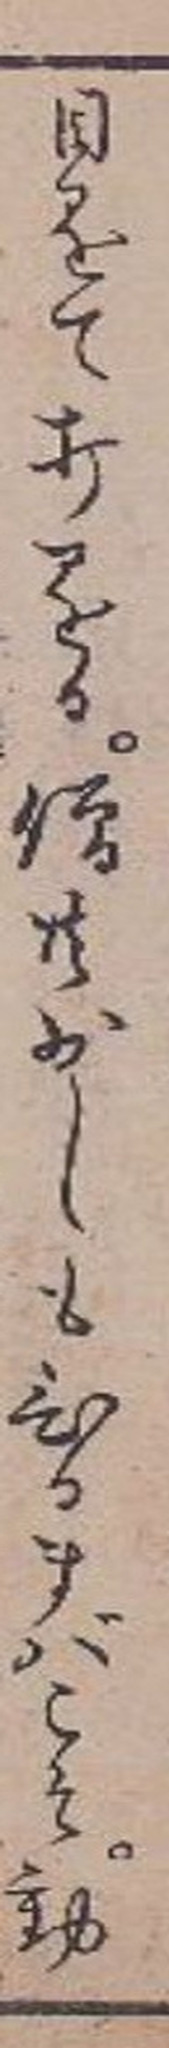目懸て打懸る、僧共少しもひるまばこそ、動
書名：琉球談
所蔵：University of the Ryukyus Library
